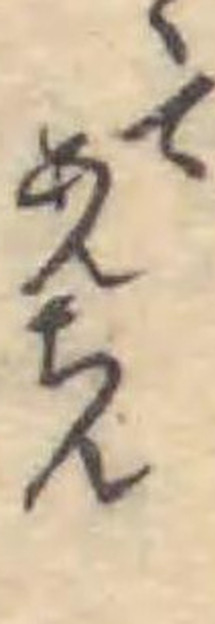あんちん
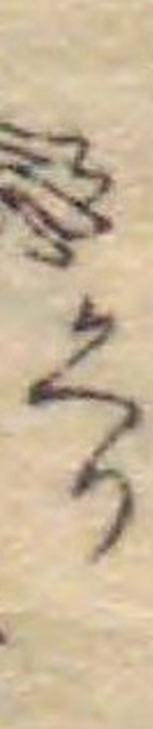かへり
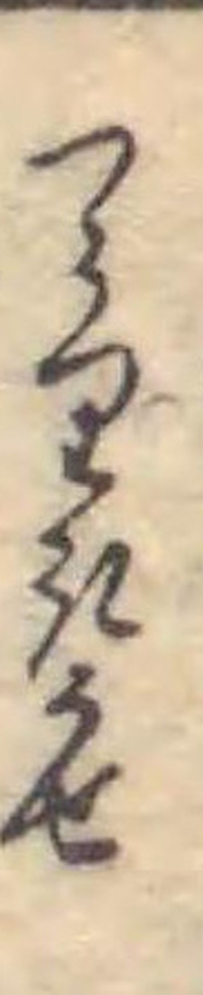つうりきうせ
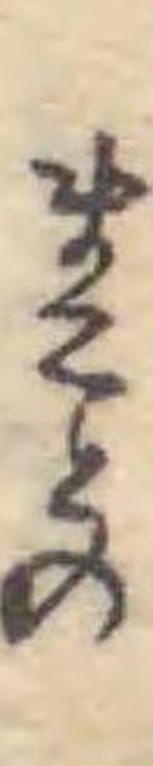まことの
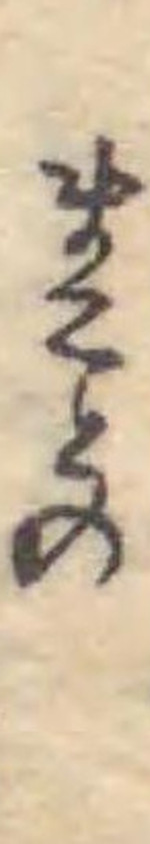まことの
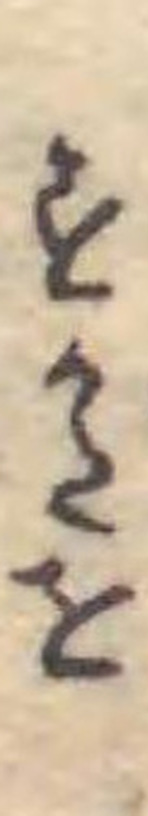すかたを
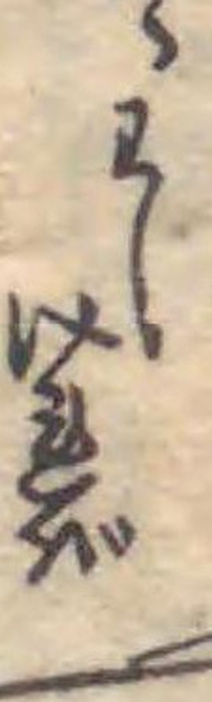ければ
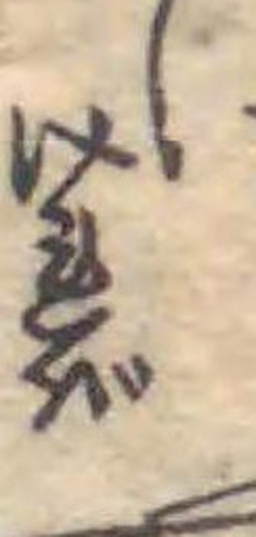ければ
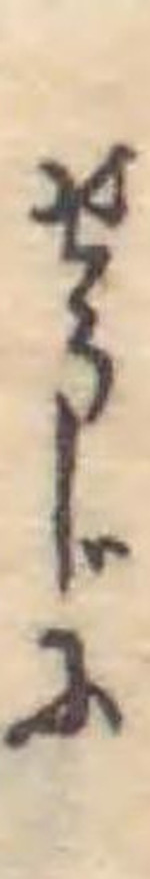せうじに
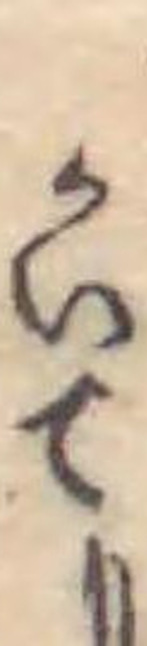かいて

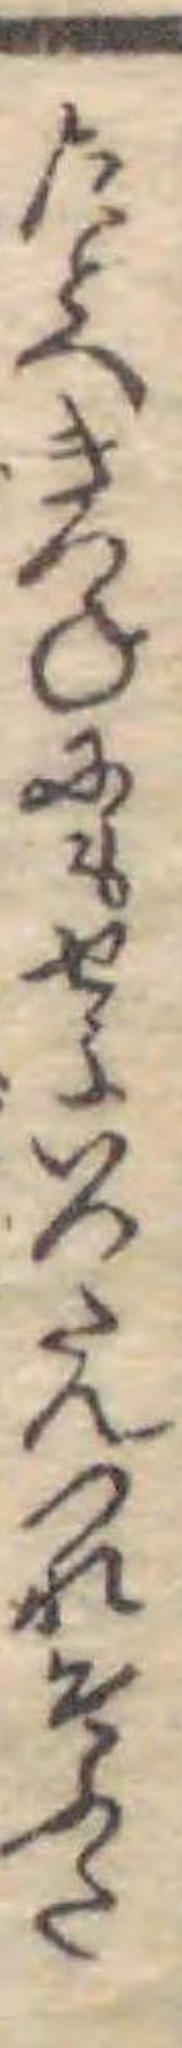たとへきつねにもせよいつたんつれそふた
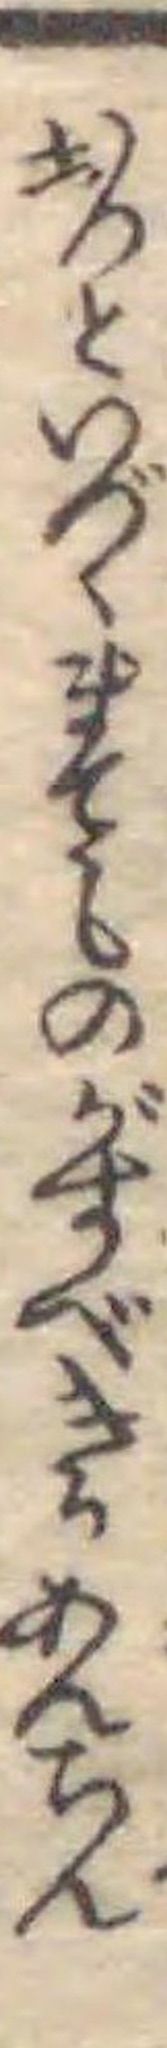おつといづくまてものがすべきかあんちん
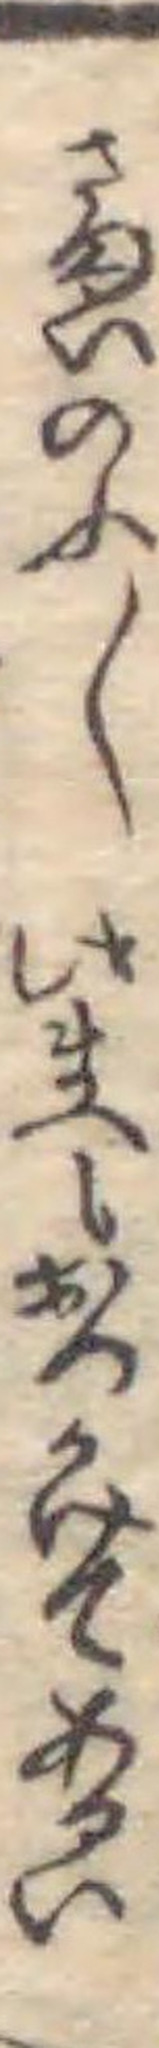さまはのふ〳〵此まへもおつかけてあるい
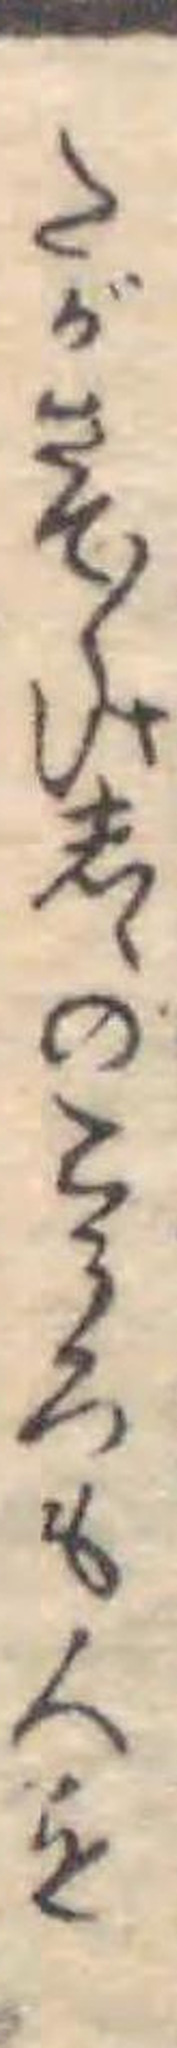たがさて〳〵此しゝのこうろも人を
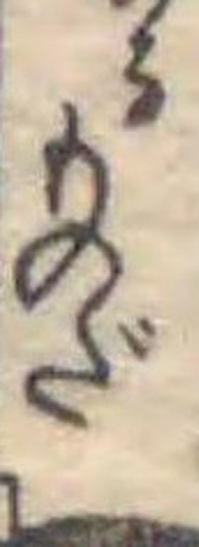ものだ
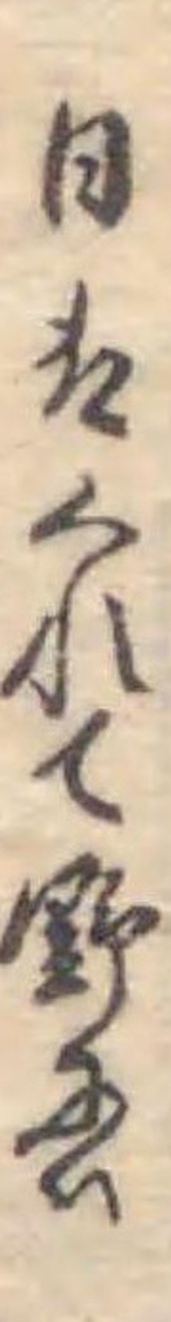日はくれて野には
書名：鐘入七人化粧 : 3巻
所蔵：国立国会図書館 National Diet Library, JAPAN
